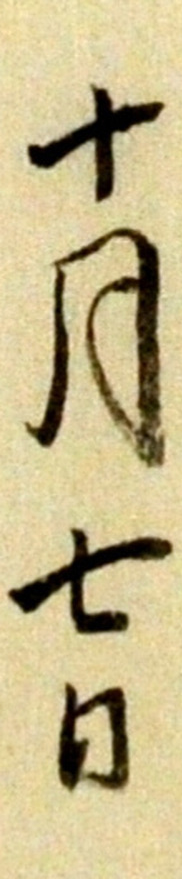十月七日
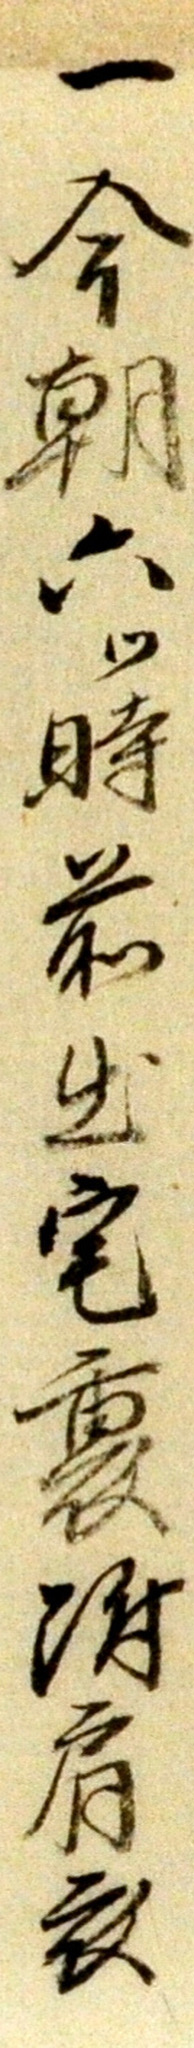一今朝六ツ時前出宅裏附肩衣
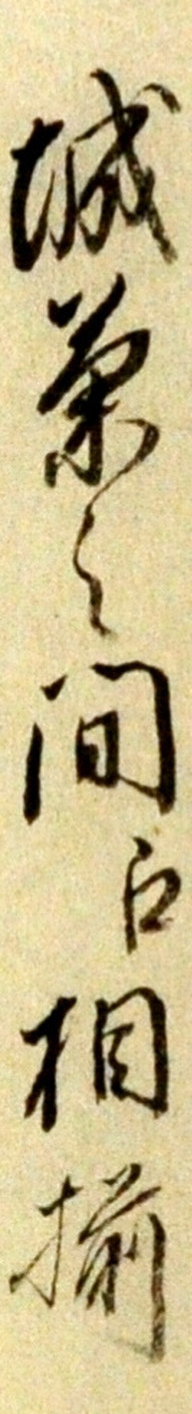城菊之間え相揃
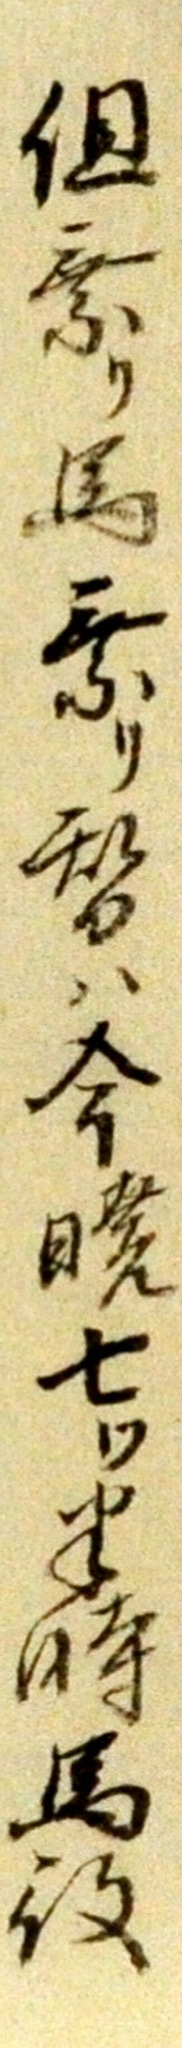但乗り馬乗り替は今暁七ツ半時馬役
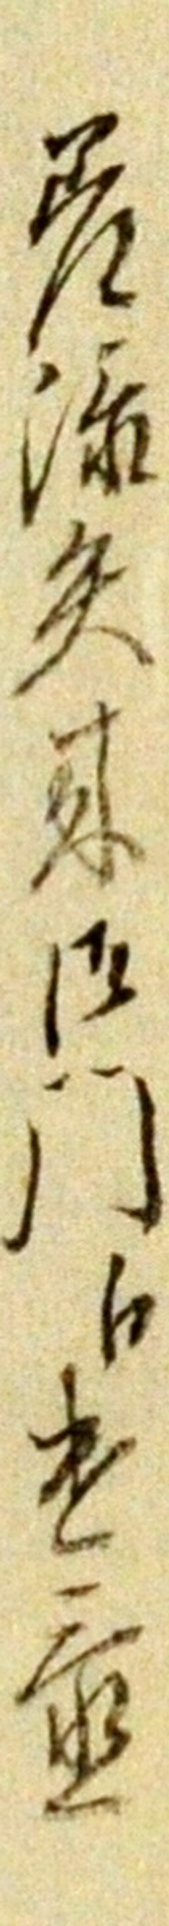差添矢来御門え遣置
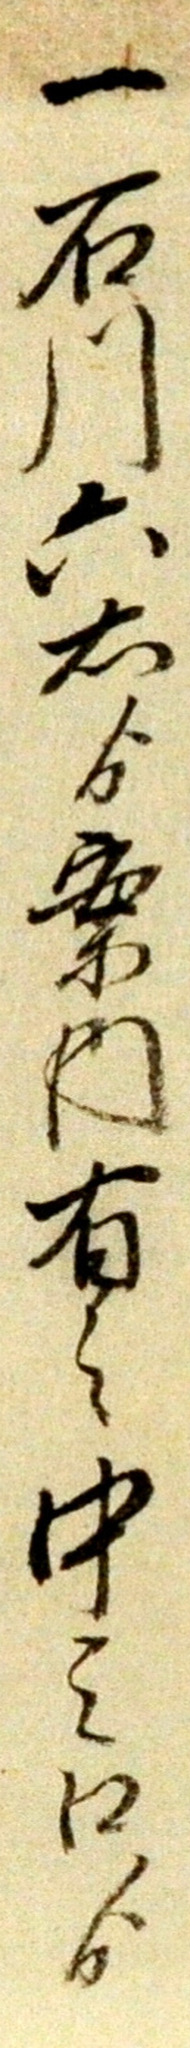一石川六右ゟ案内有之中之口ゟ
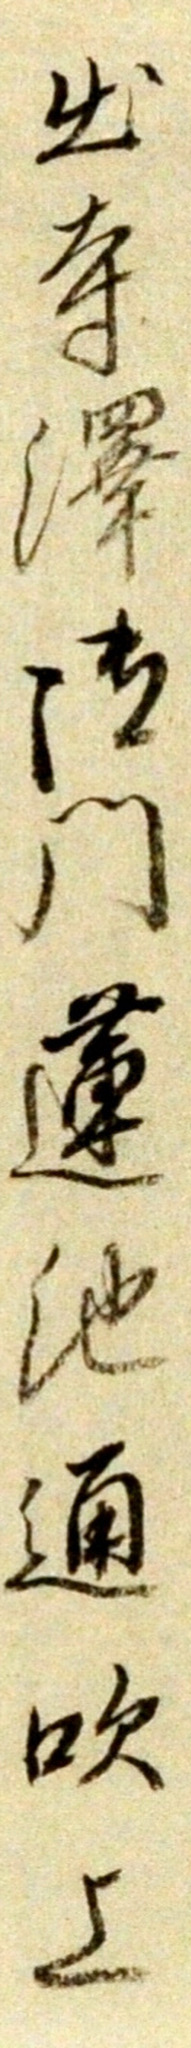出寺沢御門蓮池通吹上
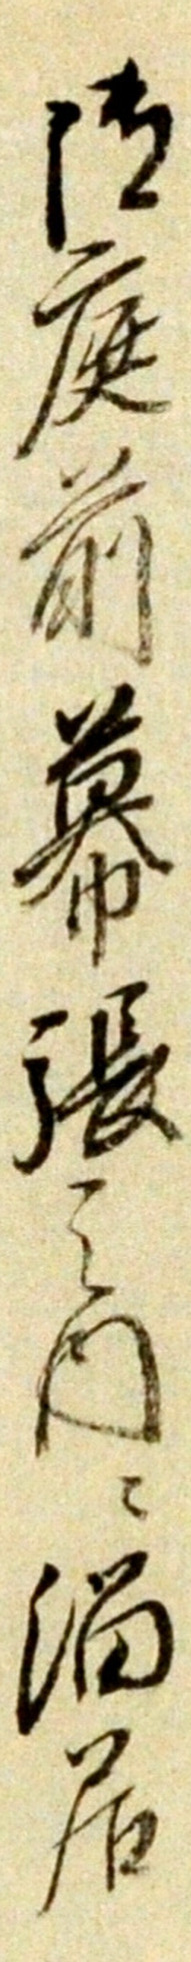御庭前幕張之内に溜居

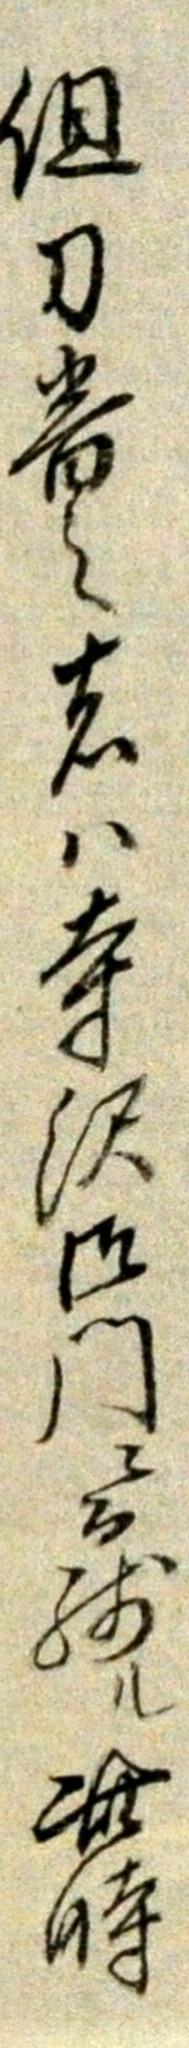但刀番之者は寺沢御門に而残ル此時
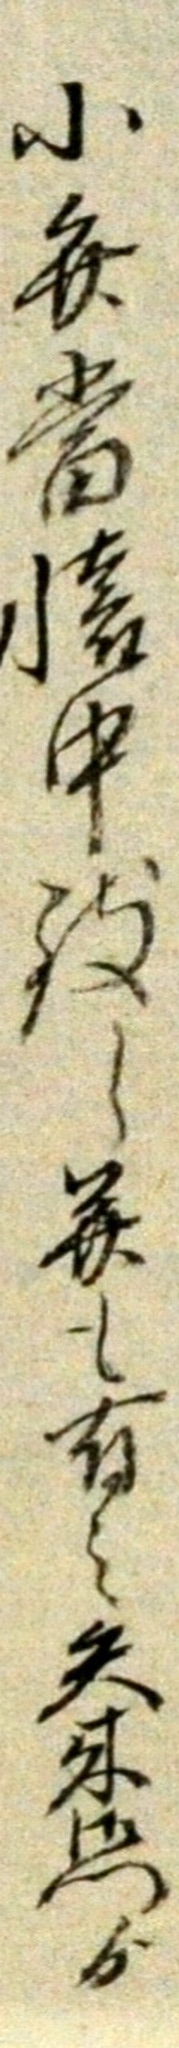小弁当懐中致し并も有之矢来御門ゟ
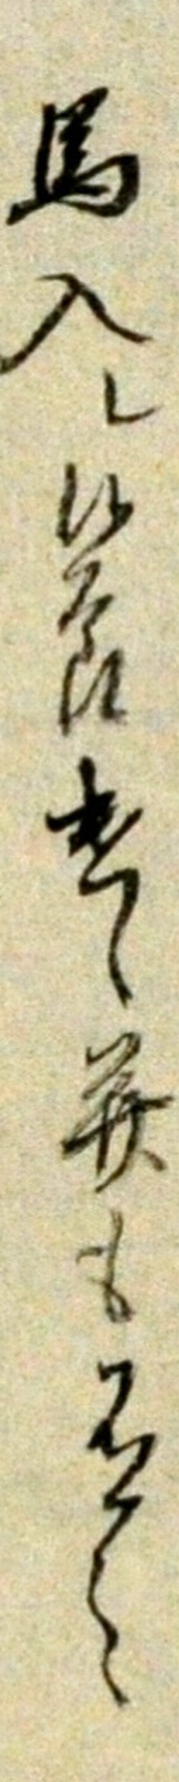馬入レ候節遣候并も有之
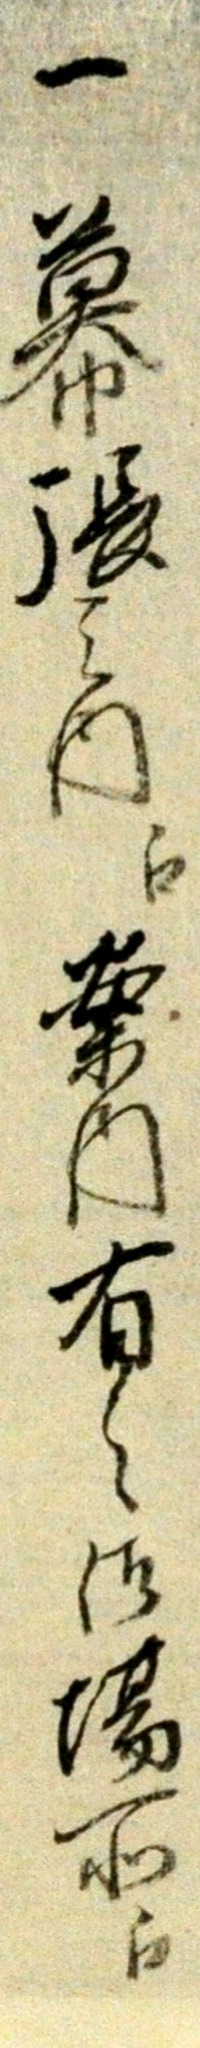一幕張之内え案内有之御場所え
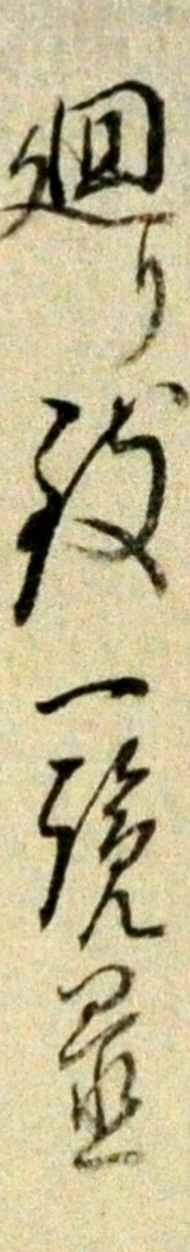廻り致一覧置
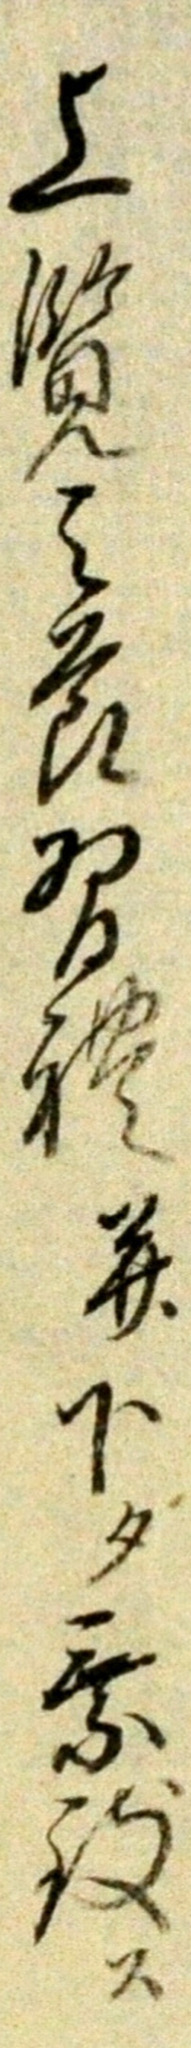上覧之節習礼并下タ乗致ス
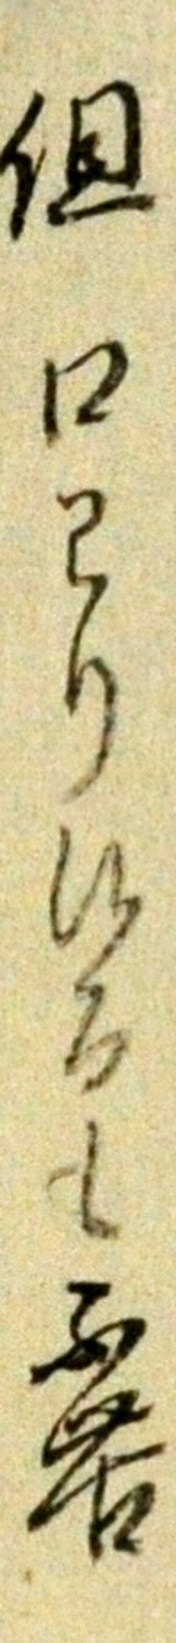但口わり候而も不苦
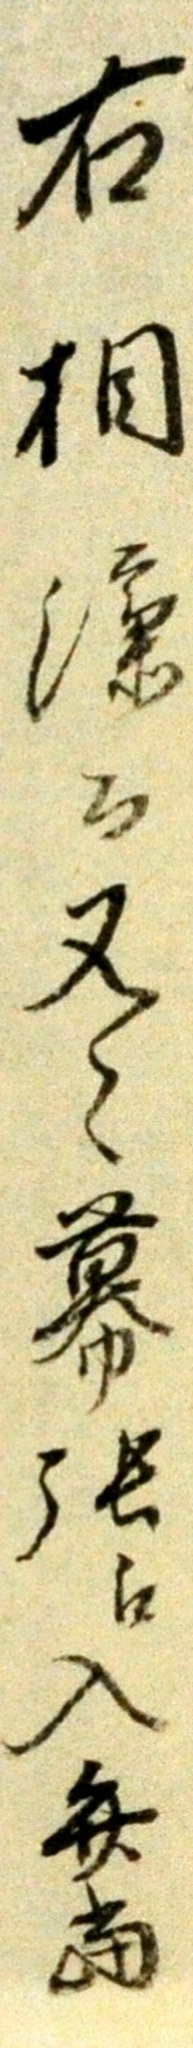右相済而又々幕張え入弁当
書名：吹上御庭ニ於テ乗馬上覧ノ節留書外
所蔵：伊那市立高遠町図書館・合同会社AMANE
